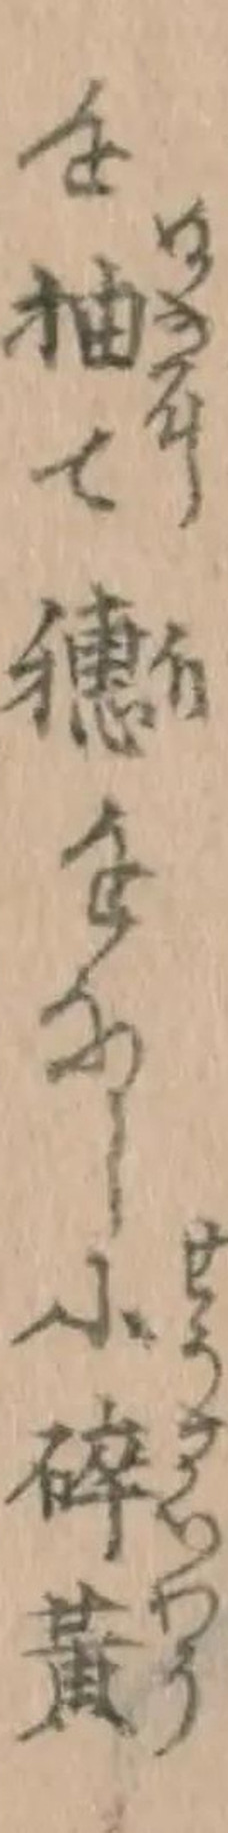を抽て穂をなし小砕黄
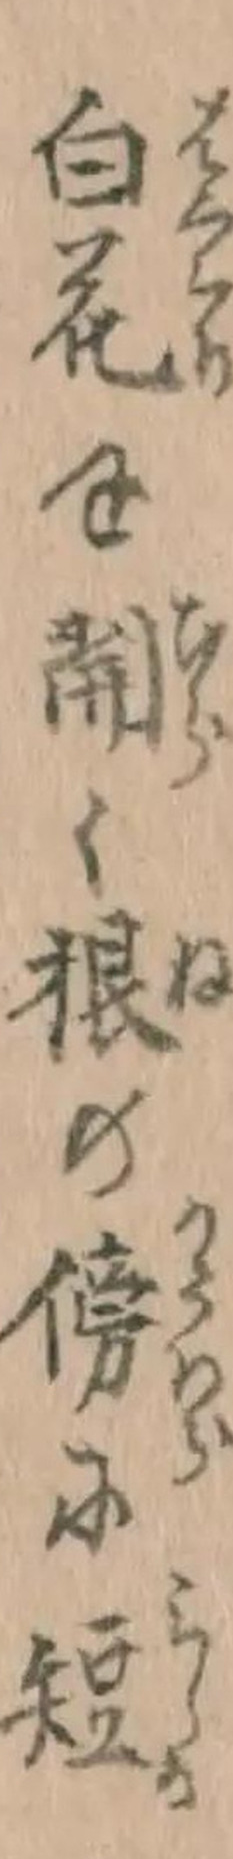白花を開く根の傍に短
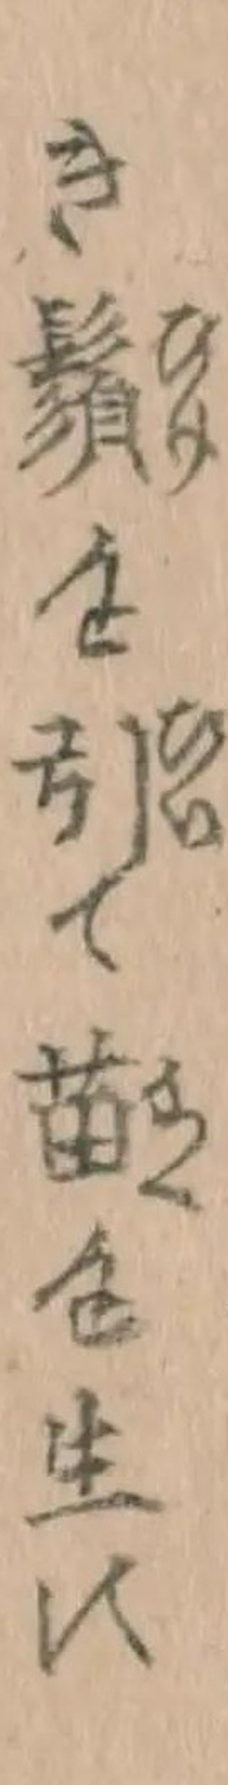き鬚を引て苗を生す
